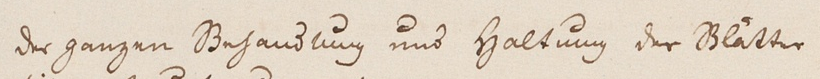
der ganzen Behandlung und Haltung der Blätter
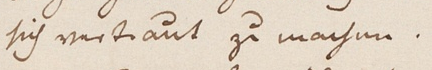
sich vertraut zu machen.
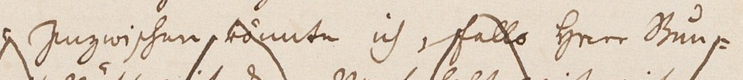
Inzwischen könnte ich, falls Herr Bun-
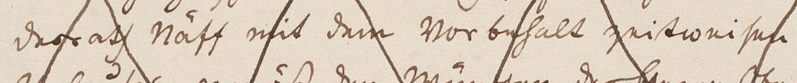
desrath Näff mit dem Vorbehalt zeitweisen
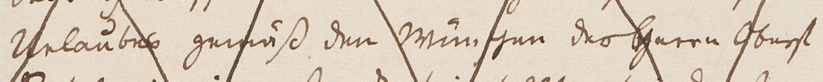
Urlaubes gemäß den Wünschen des Herrn Oberst
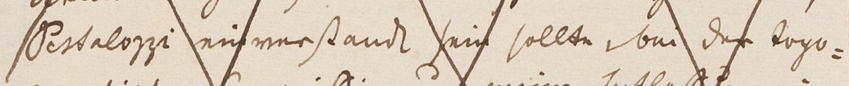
Pestalozzi einverstanden sein sollte, bei der topo-
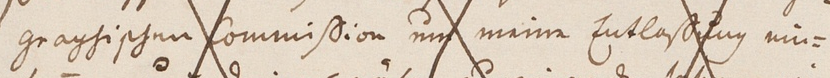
graphischen Commission um meine Entlaßung ein-
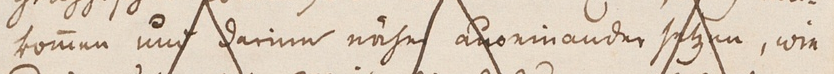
kommen und darinn näher auseinander setzen, wie
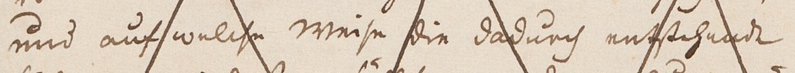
und auf welche Weise die dadurch entstehende
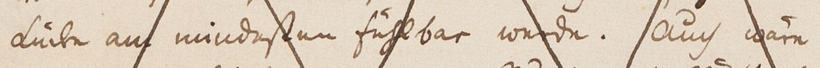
Lücke am mindesten fühlbar werde. Auch wäre
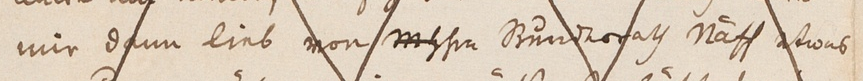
mir dann lieb von MHHrn Bundesrath Näff etwas
